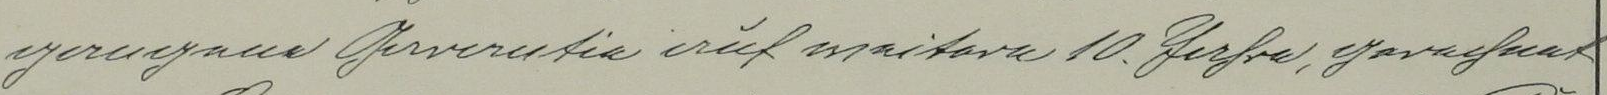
gangene Garantie auf weitere 10. Jahre, gerechnet
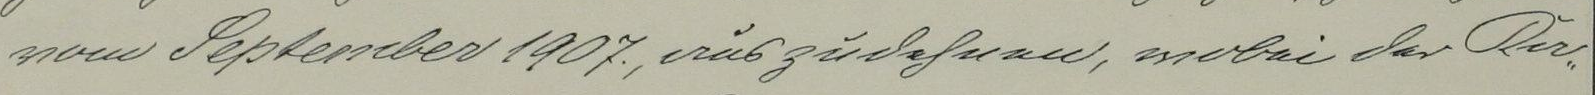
vom September 1907., auszudehnen, wobei der Ka-
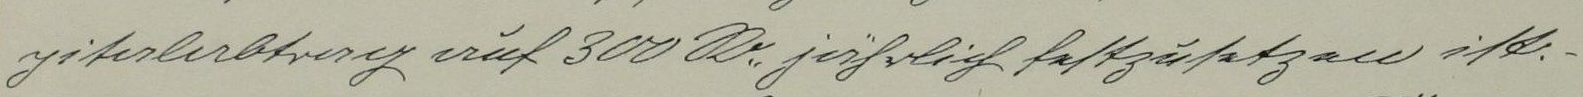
pitalabtrag auf 300 Ro. jährlich festzusetzen ist.
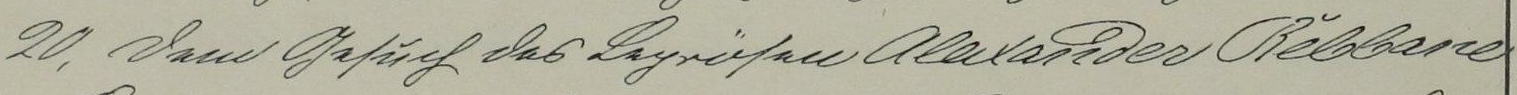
20. Dem Gesuch des Leprösen Alexander Rebbane
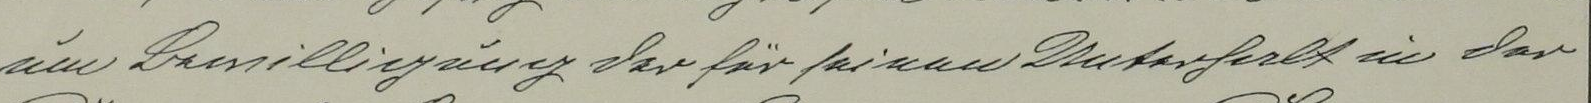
um Bewilligung der für seinen Unterhalt in der
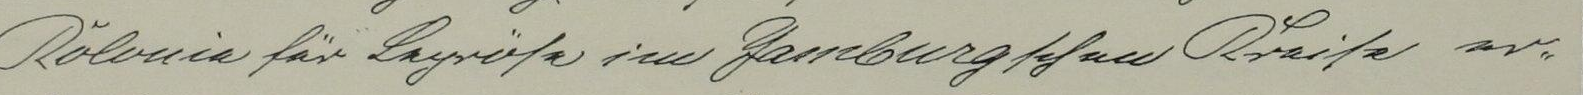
Kolonie für Lepröse im Jamburgschen Kreise er-
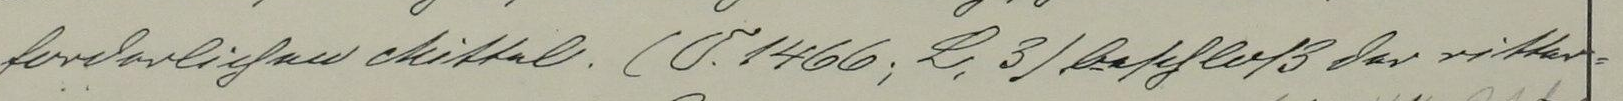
forderlichen Mittel. (T.1466; L.3) beschloß der ritter-
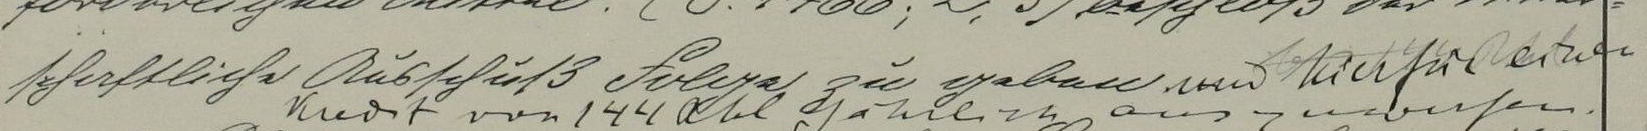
schaftliche Ausschuß Folge zu geben und hierfür einen
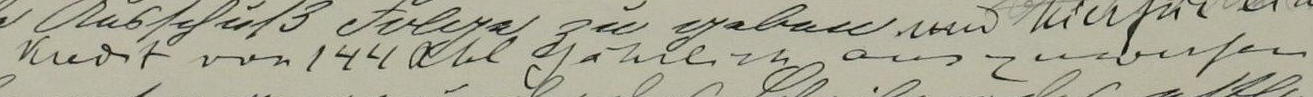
Kredit von 144 Rbl jährlich auszuwerfen.
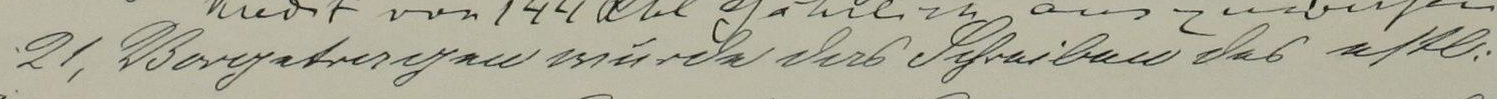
21. Vorgetragen wurde das Schreiben des estl.
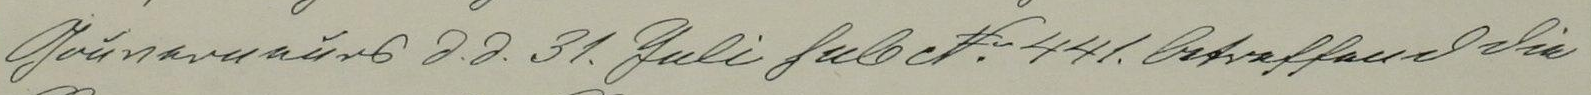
Gouverneurs d.d. 31. Juli sub No. 441. betreffend die
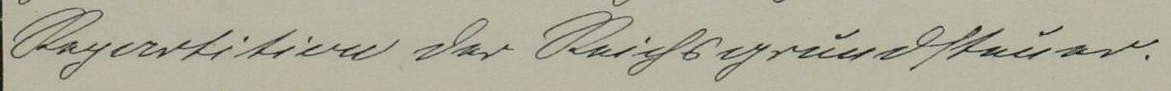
Repartition der Reichsgrundsteuer.
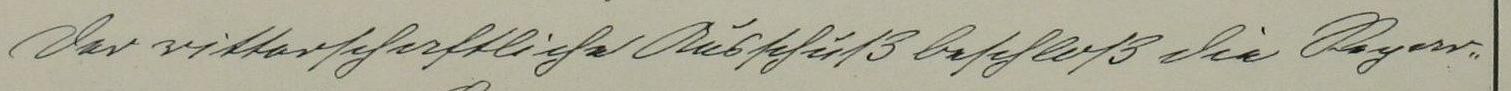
Der ritterschaftliche Ausschuß beschloß die Repar-
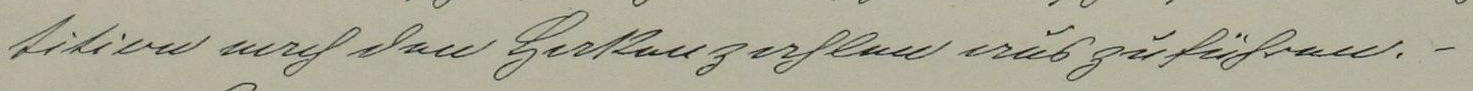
tition nach den Hakenzahlen auszuführen.
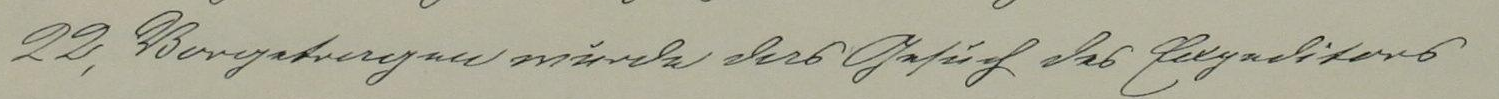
22. Vorgetragen wurde das Gesuch des Expeditors
